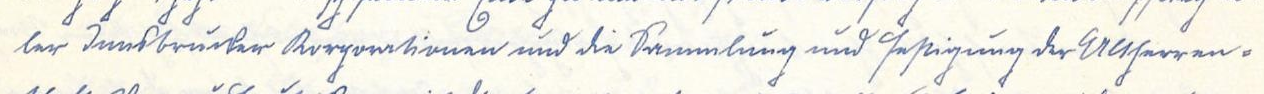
ler Innsbrucker Korporationen und die Sammlung und Festigung der Altherren-
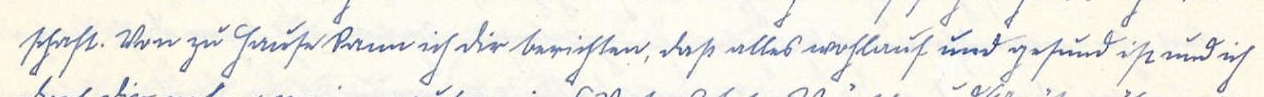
schaft. Von zu Hause kann ich dir berichten, dass alles wohlauf und gesund ist und ich
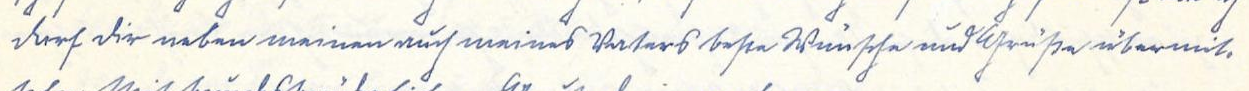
darf dir neben meinen auch meines Vaters beste Wünsche und Grüße übermit-
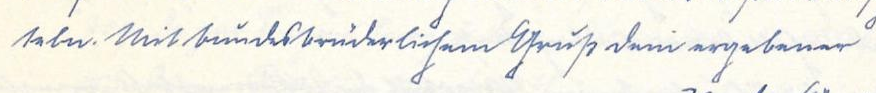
teln. Mit bundesbrüderlichem Gruß dein ergebener
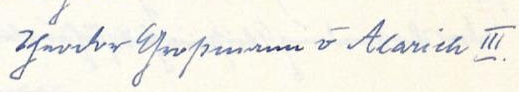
Theodor Großmann v/o Alarich III.
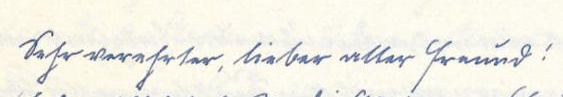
Sehr geehrter, lieber alter Freund!
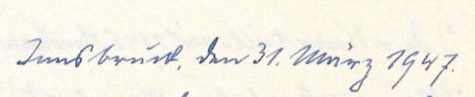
Innsbruck, den 31. März 1947.
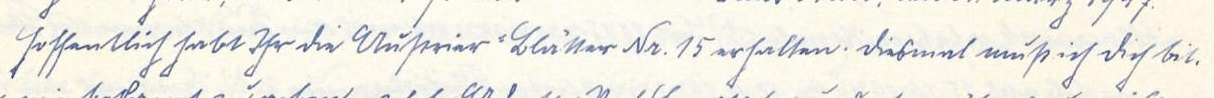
Hoffentlich habt Ihr die Austrier-Blätter Nr. 15 erhalten. Diesmal muss ich dich bit-
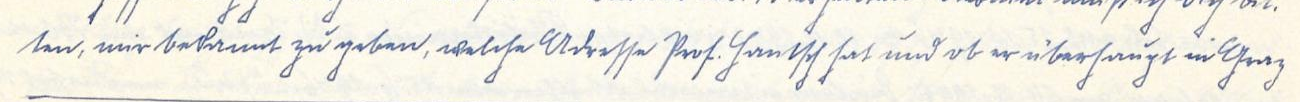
ten, mir bekanntzugeben, welche Adresse Prof. Gautsch hat und ob er überhaupt in Graz
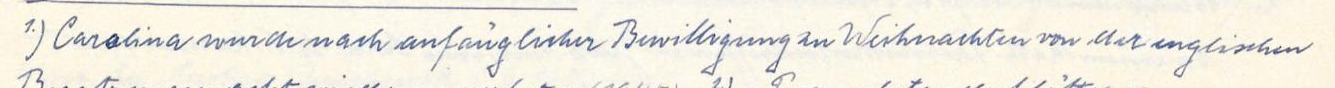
1) Carolina wurde nach anfänglicher Bewilligung zu Weihnachten von der englischen
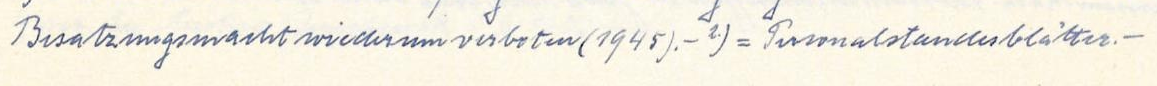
Besatzungsmacht wiederum verboten (1945).- 2) = Personalstandesblätter.
